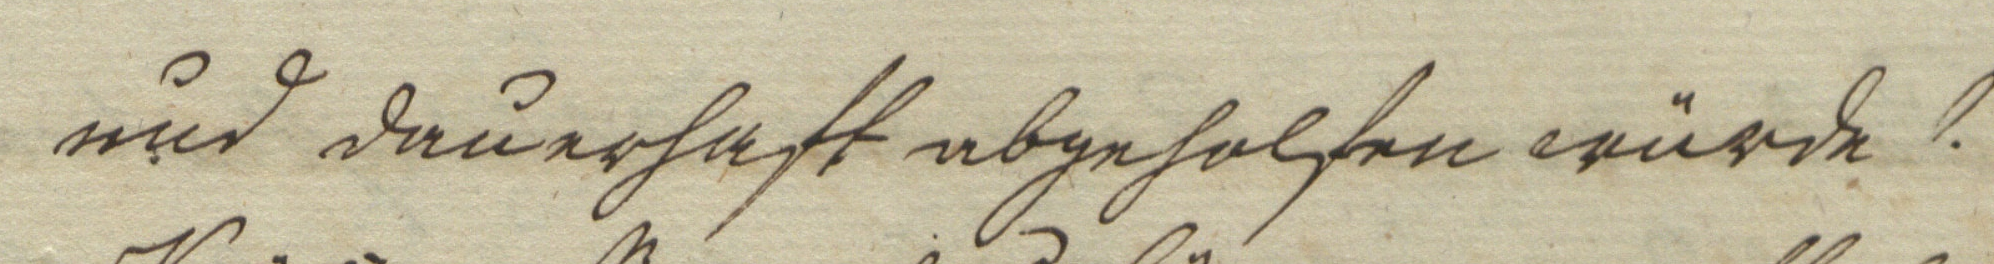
und dauerhaft abgeholfen würde?
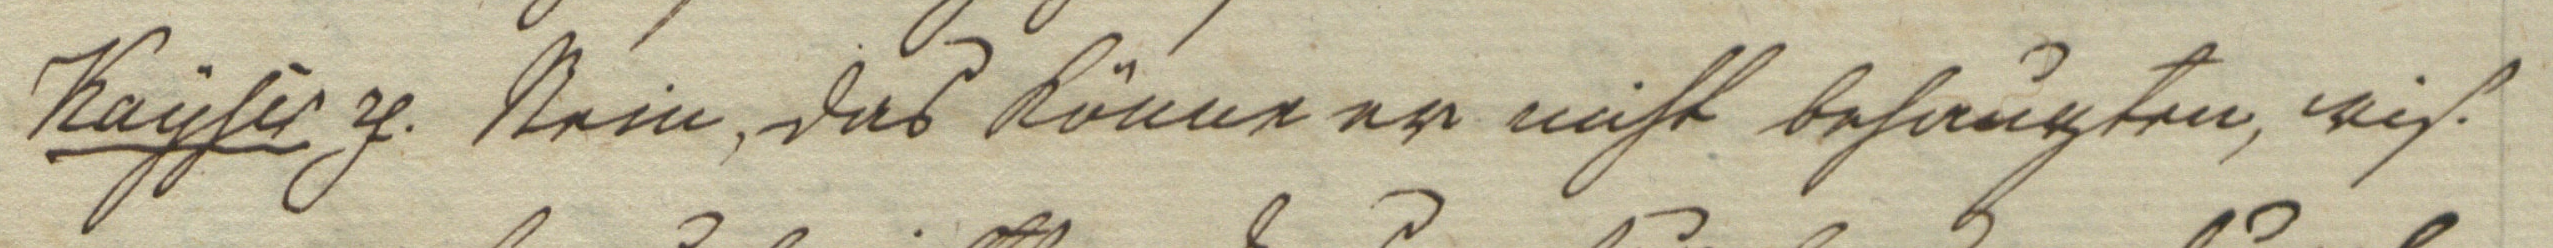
Kaÿser rf. Nein, das könne er nicht behaupten, wis¬
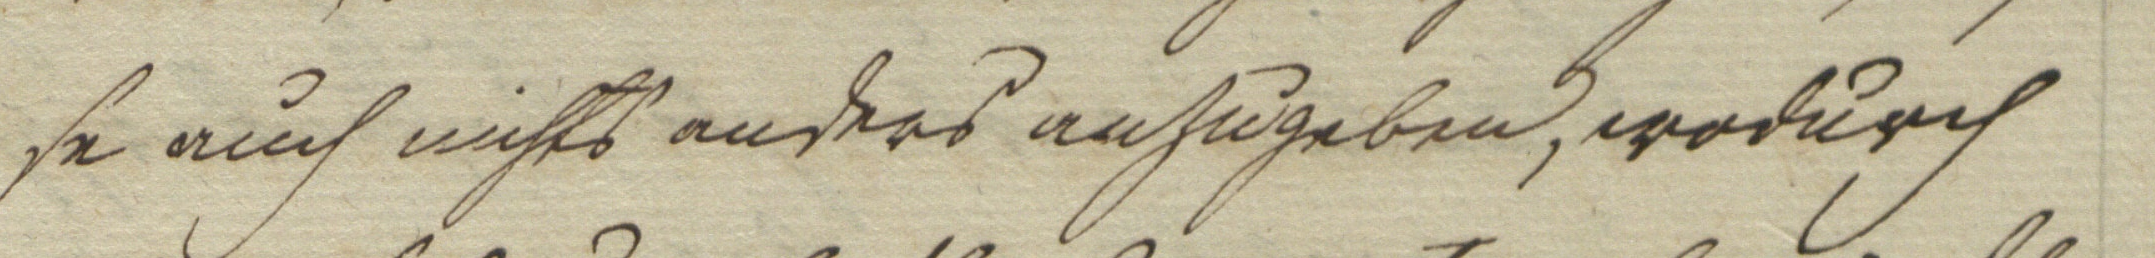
se auch nichts anders anzugeben, wodurch
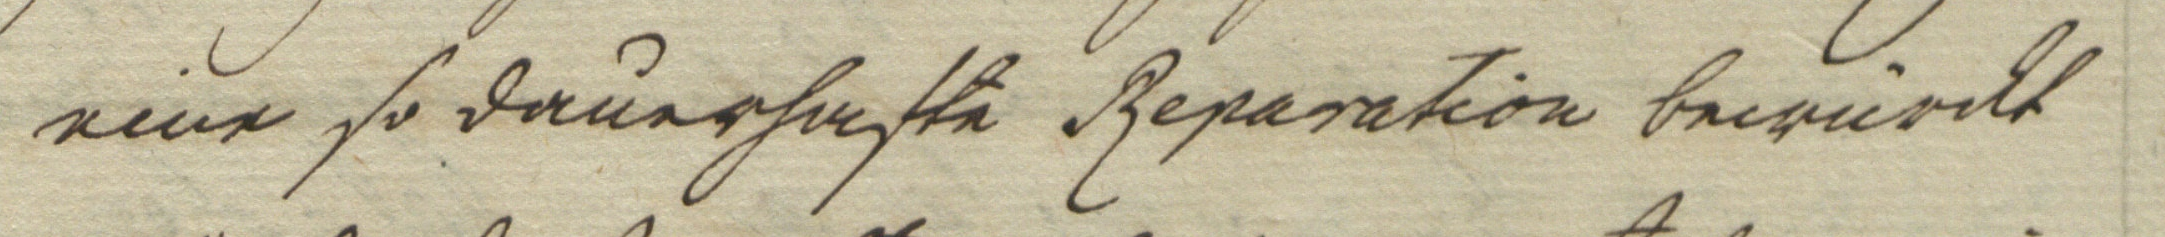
eine so dauerhafte Reparation bewürckt
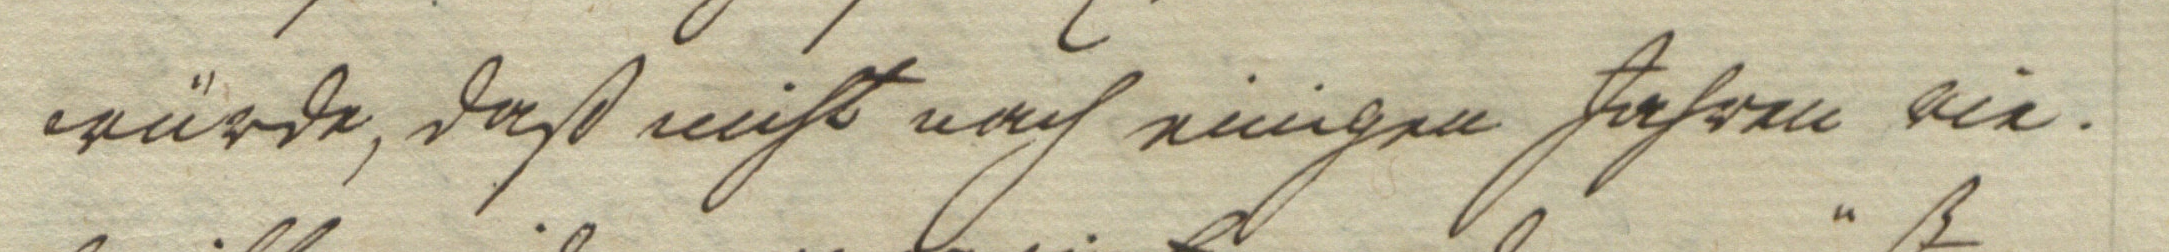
würde, daß nicht nach einigen Jahren vie¬
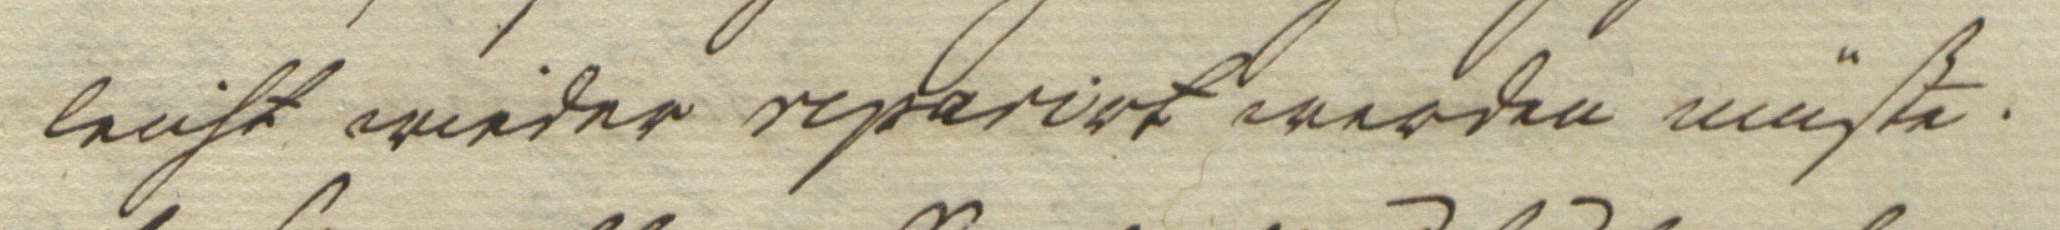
leicht wieder reparirt werden müßte.
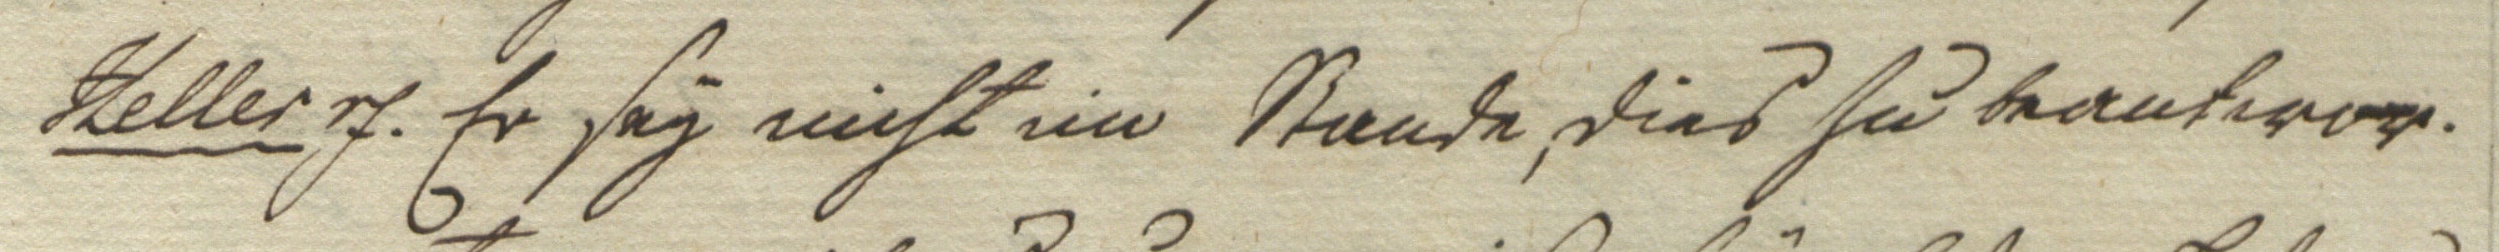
Heller rf. Er seÿ nicht im Stande, dies zu beantwor¬
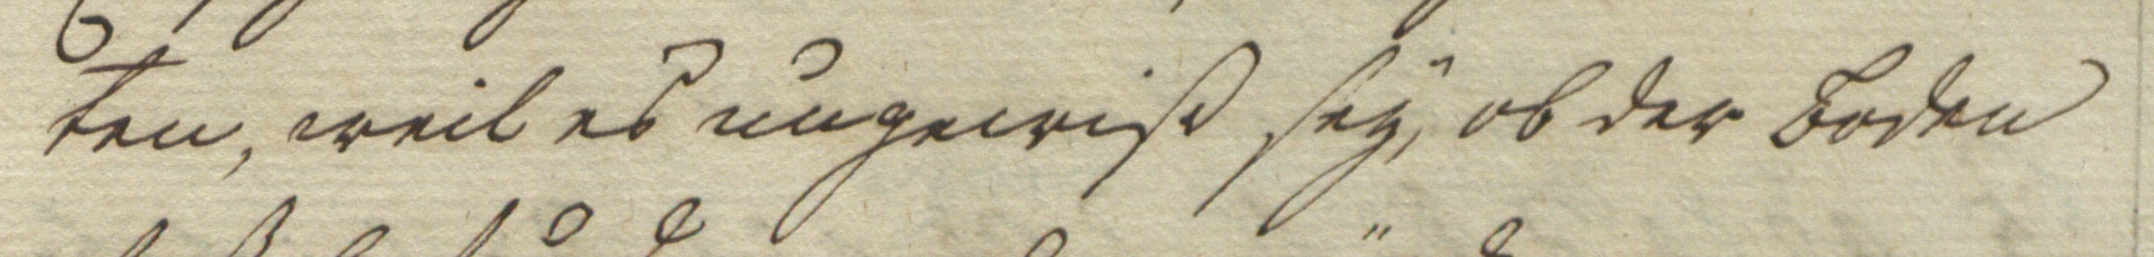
ten, weil es ungewiß seÿ, ob der Boden
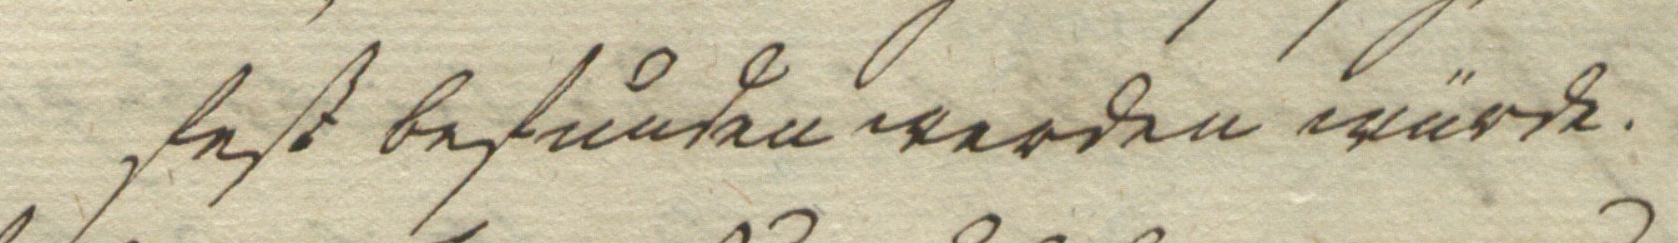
fest befunden werden würde.
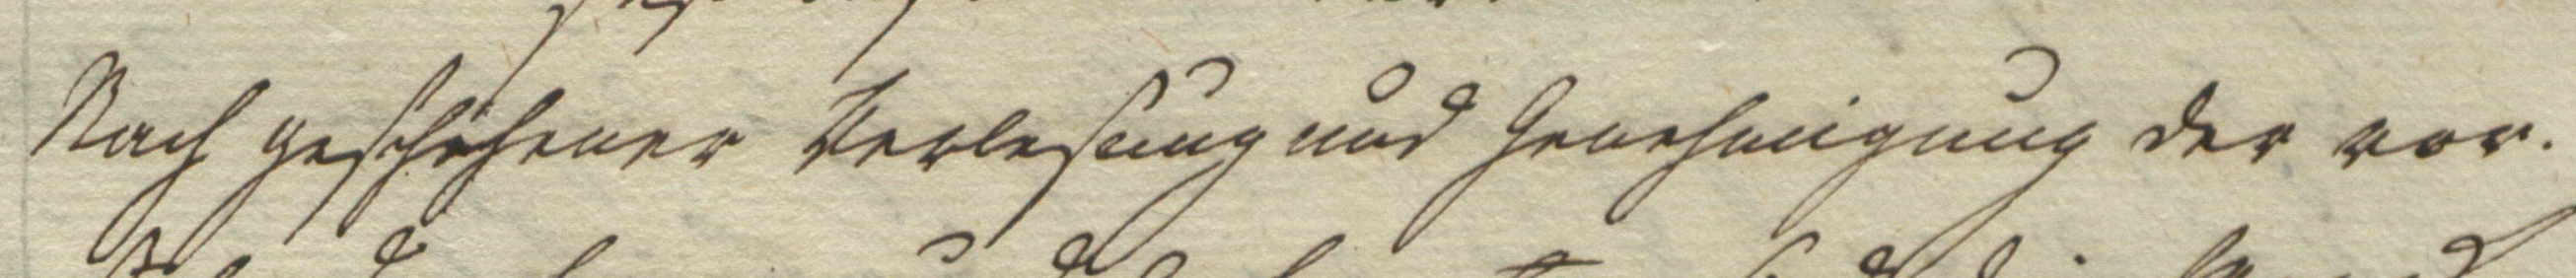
Nach geschehener Verlesung und Genehmigung der vor¬
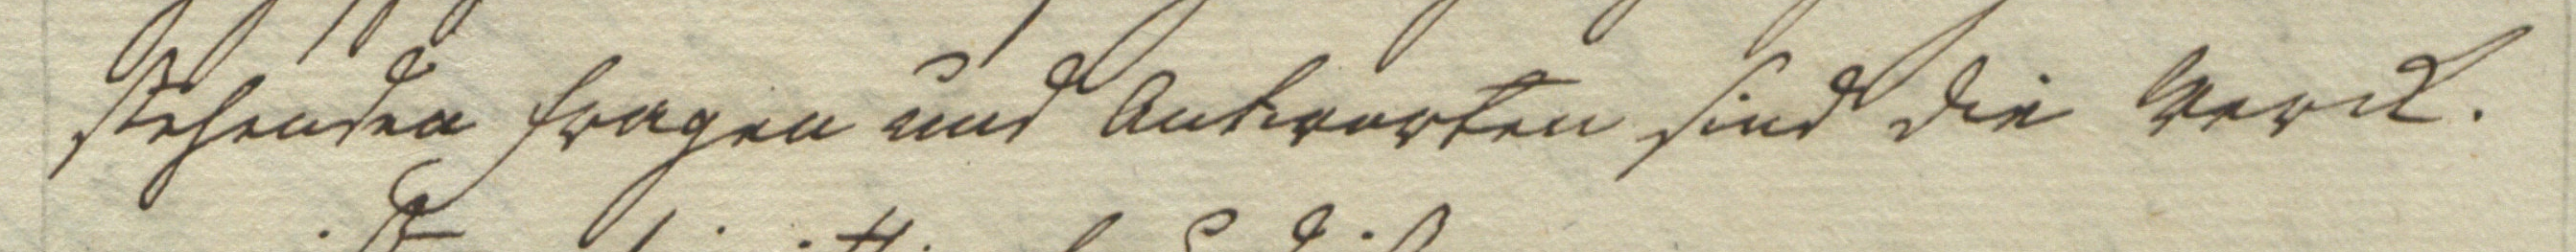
stehenden Fragen und Antworten sind die Werck¬
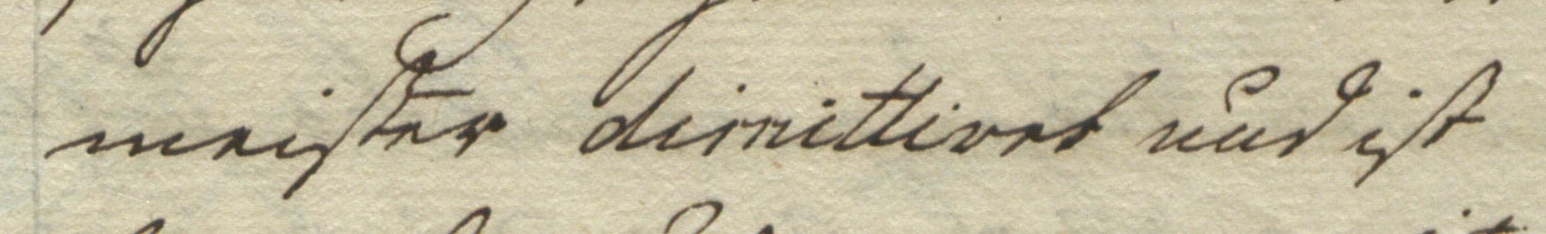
meister dimittiret und ist
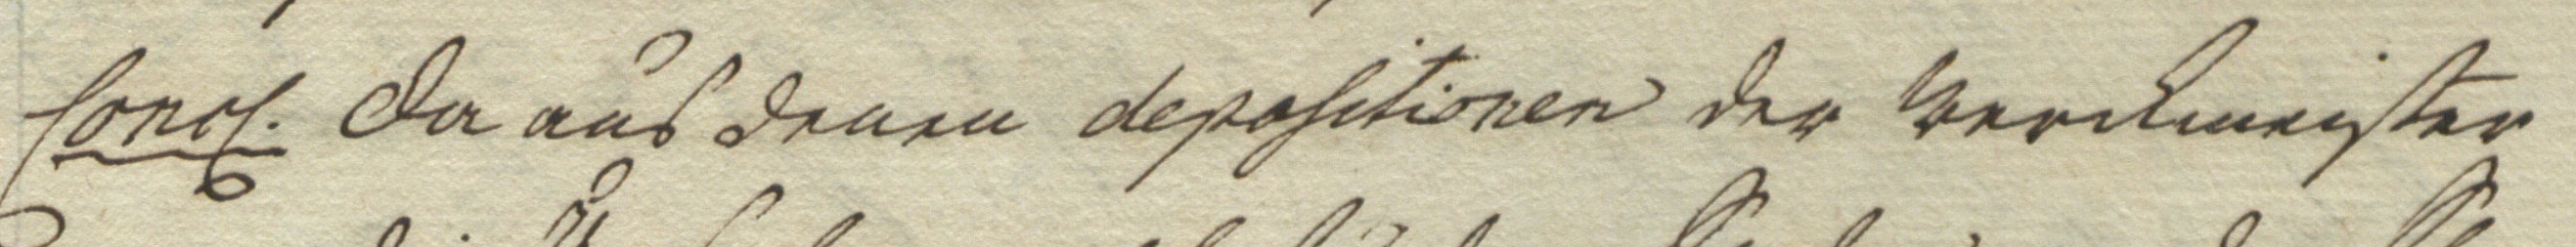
Concl. Da aus denen depositionen der Werckmeister
